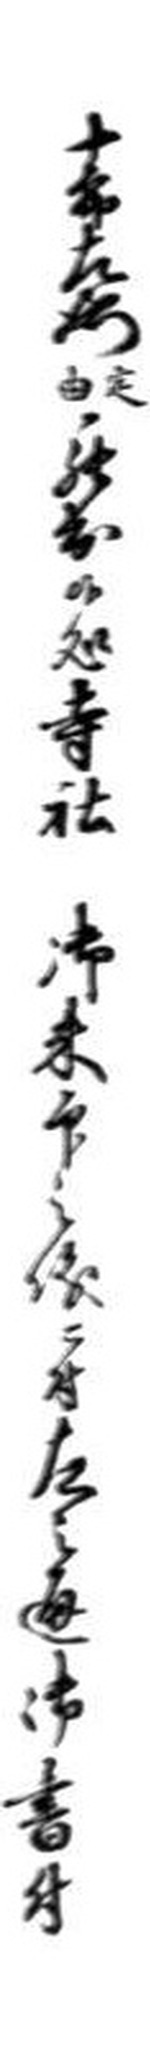十郎左衛門定由罷出候処寺社御朱印之儀ニ付左之通御書付
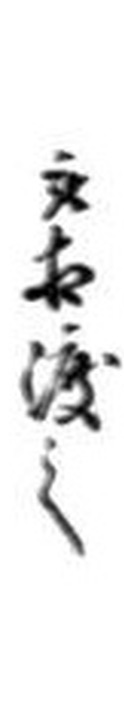被相渡之
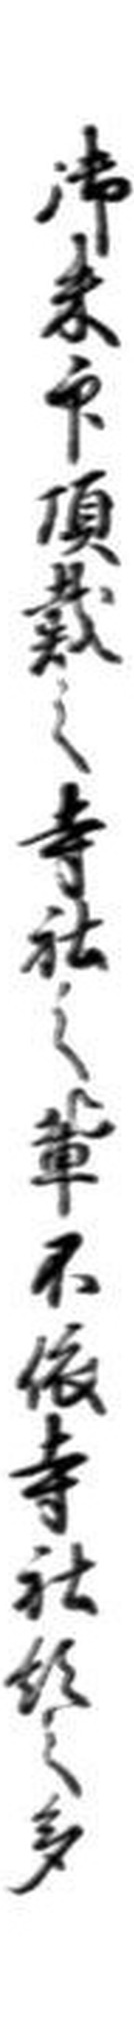御朱印頂戴之寺社之輩不依寺社領之多
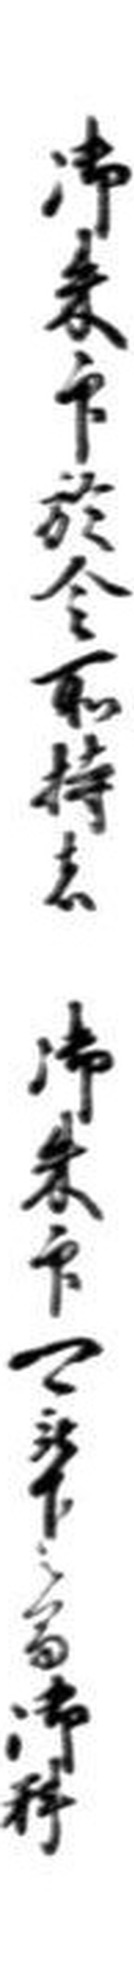御朱印於令所持者御朱印可被下之間御料
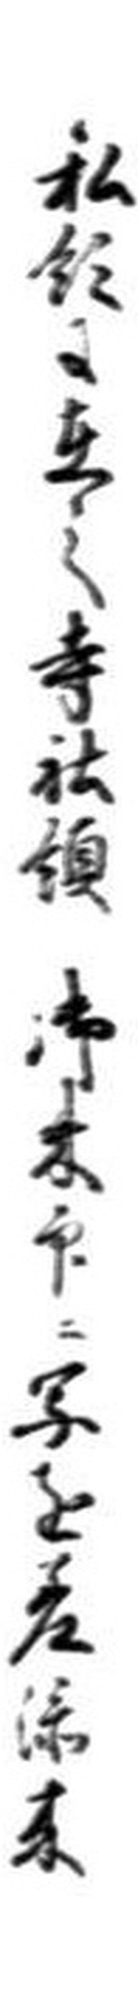私領に在之寺社領御朱印ニ写を差添来
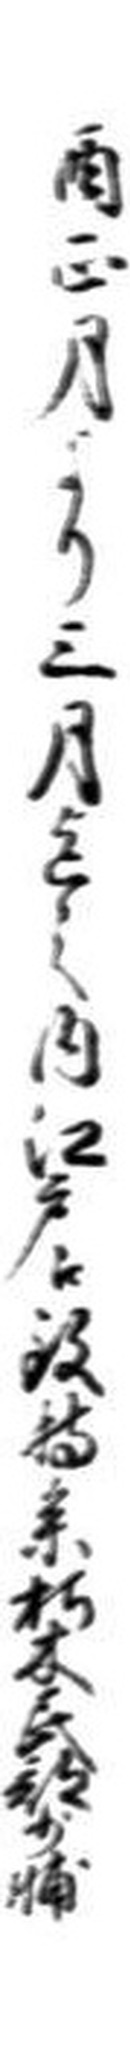酉正月より三月迄之内江戸江致持参朽木民部少輔
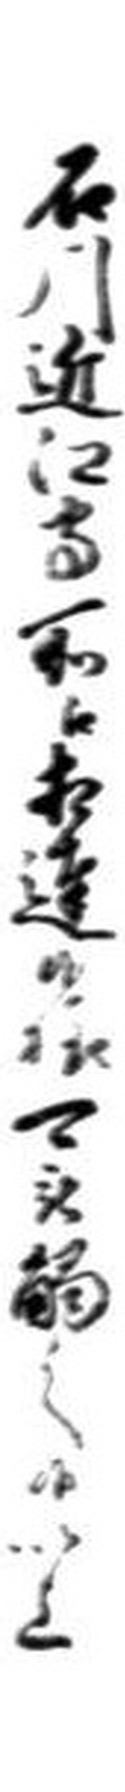石川近江守所江相達候様可被触之候以上

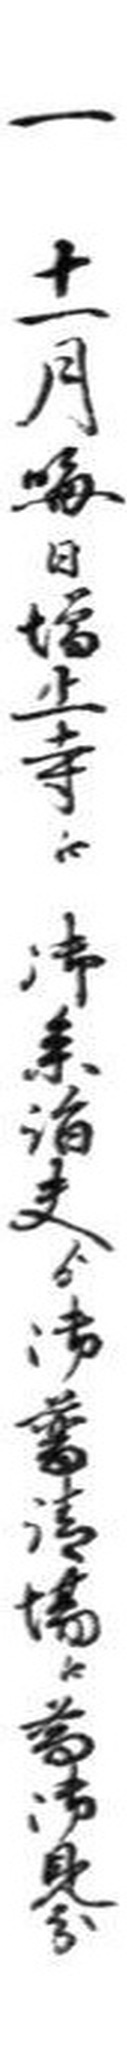一十一月晦日増上寺江御参詣夫ゟ御普請場江為御見分
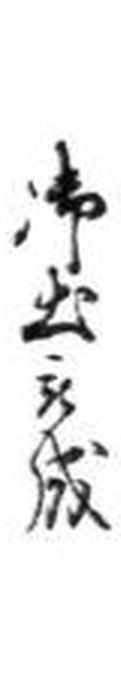御出被成
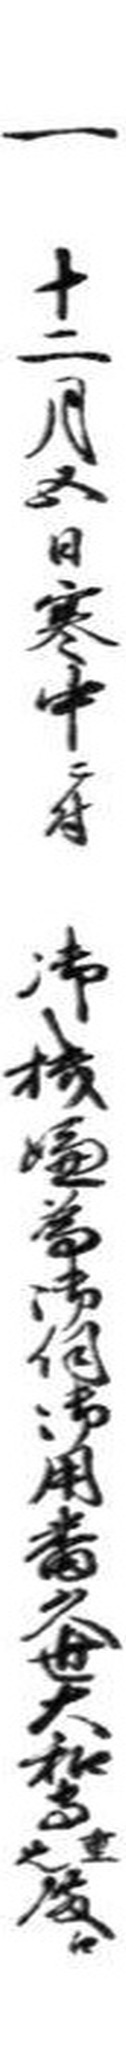一十二月五日寒中ニ付御機嫌為御伺御用番く久世大和守重之殿江
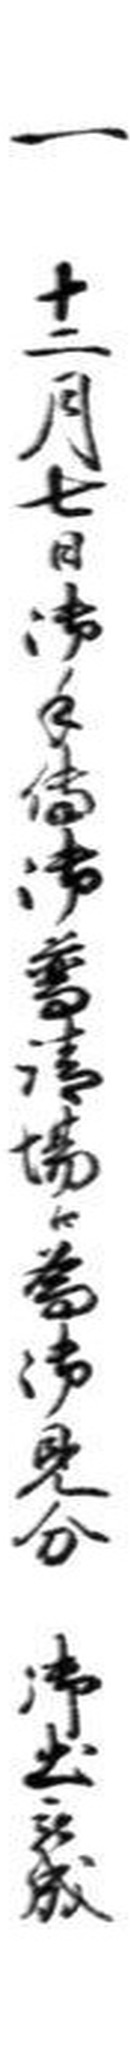一十二月七日御手伝御普請場江為御見分御出被成
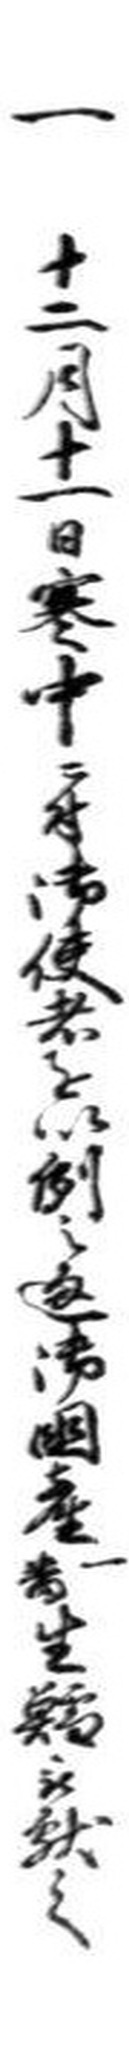一十二月十一日寒中ニ付御使者を以例之通御国産一番生鱈被献之
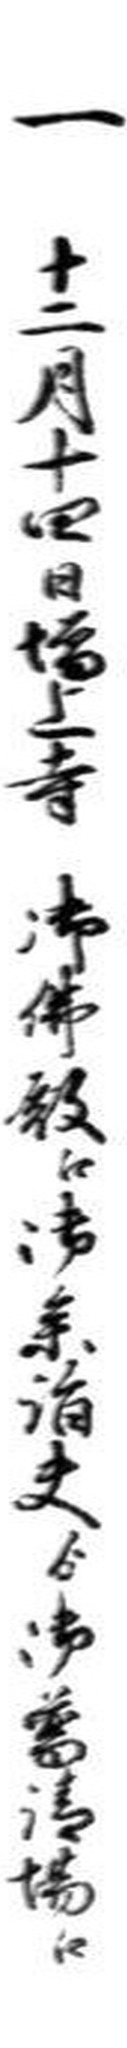一十二月十四日増上寺御仏殿江御参詣夫ゟ御普請場江
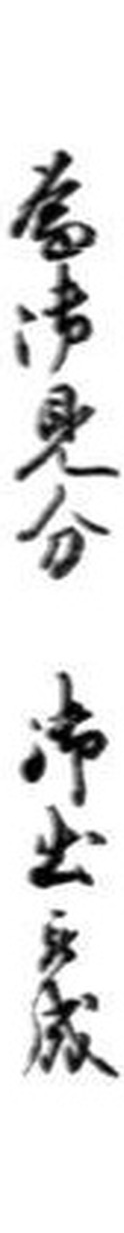為御見分御出被成
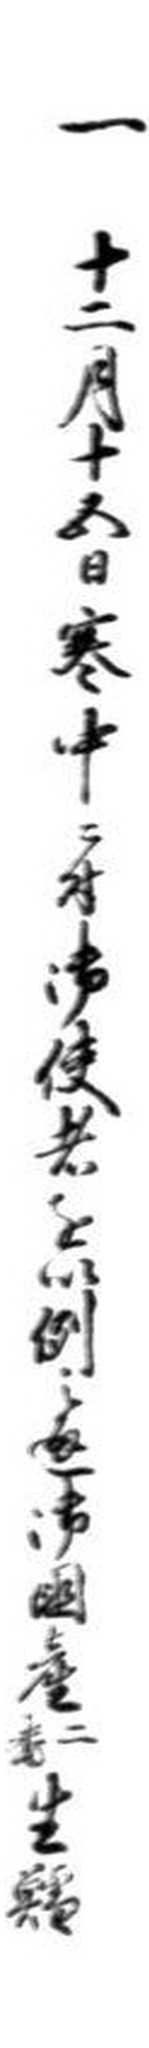一十二月十五日寒中ニ付御使者を以例之通御国産二番生鱈
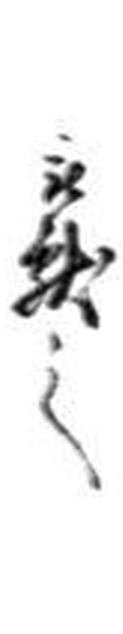被献之
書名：家譜 三十一 吉邦公 享保元年
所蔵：福井県文書館 Fukui Prefectural Archives
